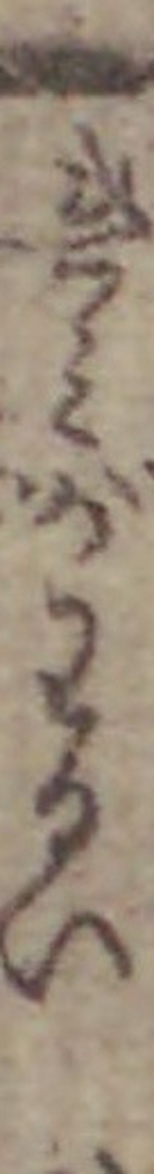きみがわるい
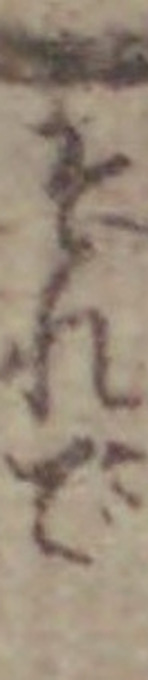それで
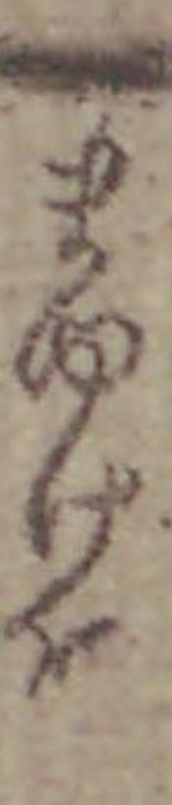まゆげを
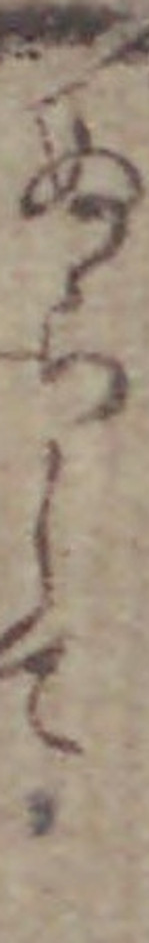ぬらして
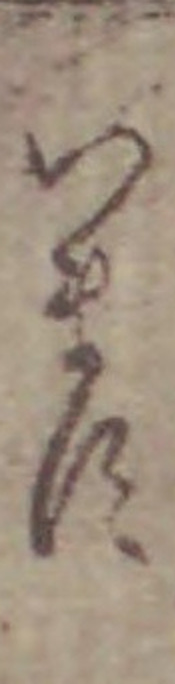います

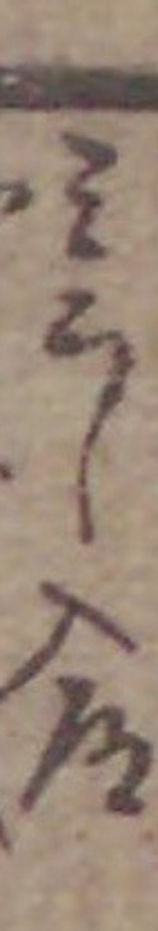みこし入道
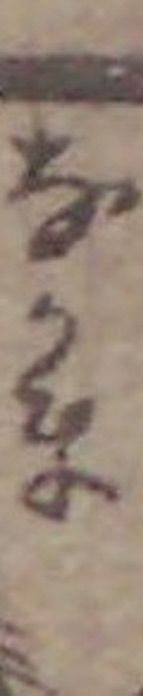なかま
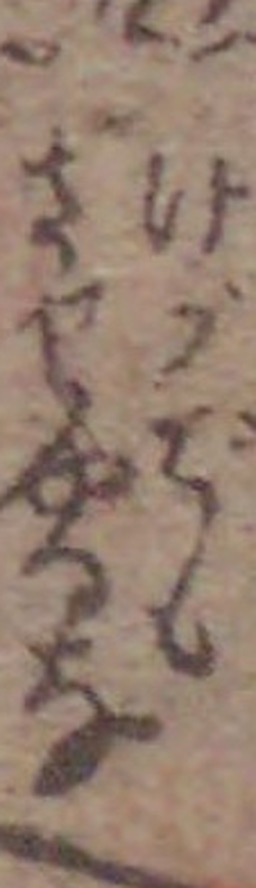させやるな
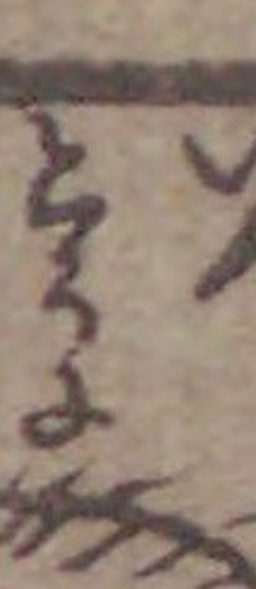とうに
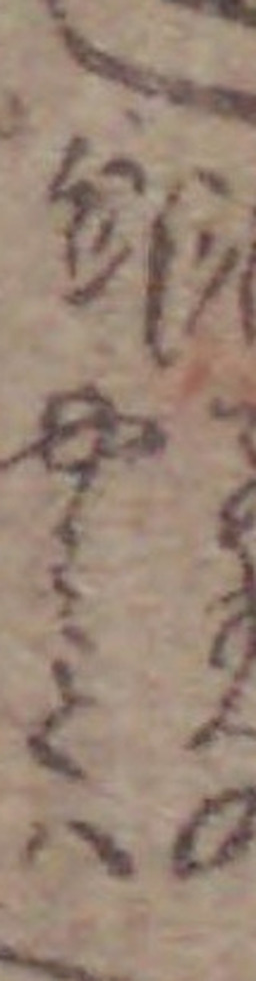やみとは
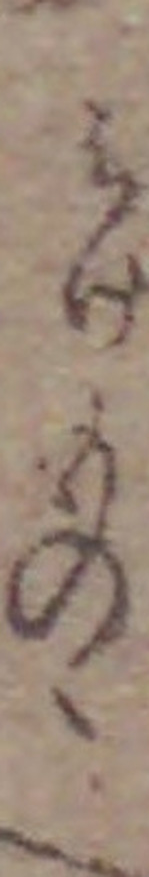ばけものゝ
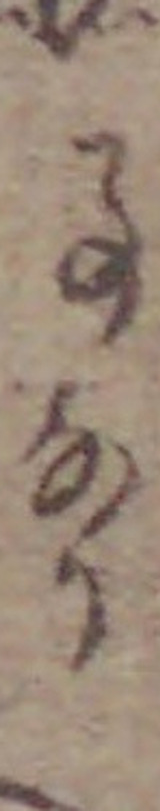事なり
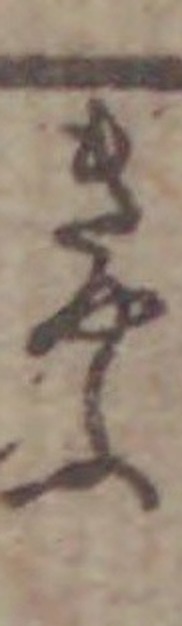きやふ
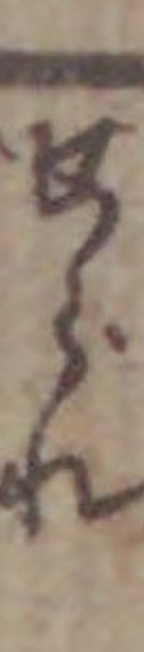せられ
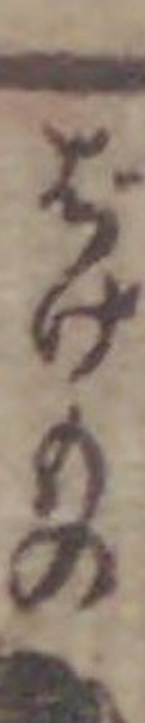ばけもの
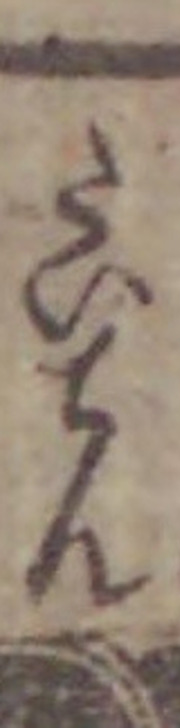たいてん
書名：化物鼻がひしげ 2巻
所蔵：国立国会図書館 National Diet Library, JAPAN
